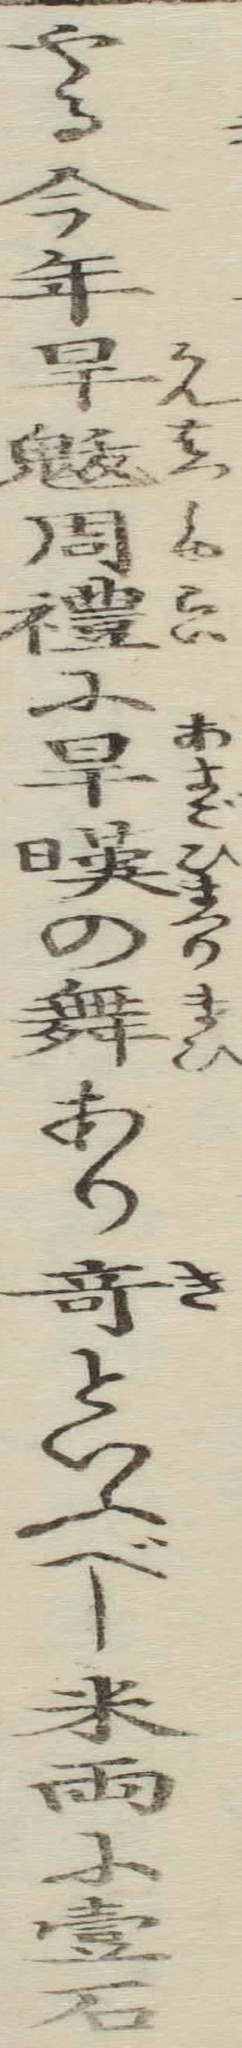やる今年旱魃周礼に旱暵の舞あり竒といふべし米両に壹石
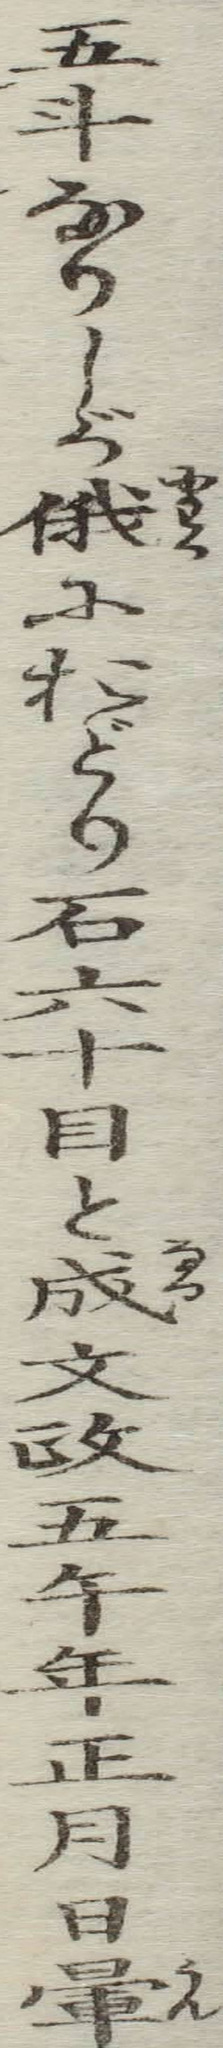五斗なりしが俄におどり石六十目と成文政五午年正月日暈
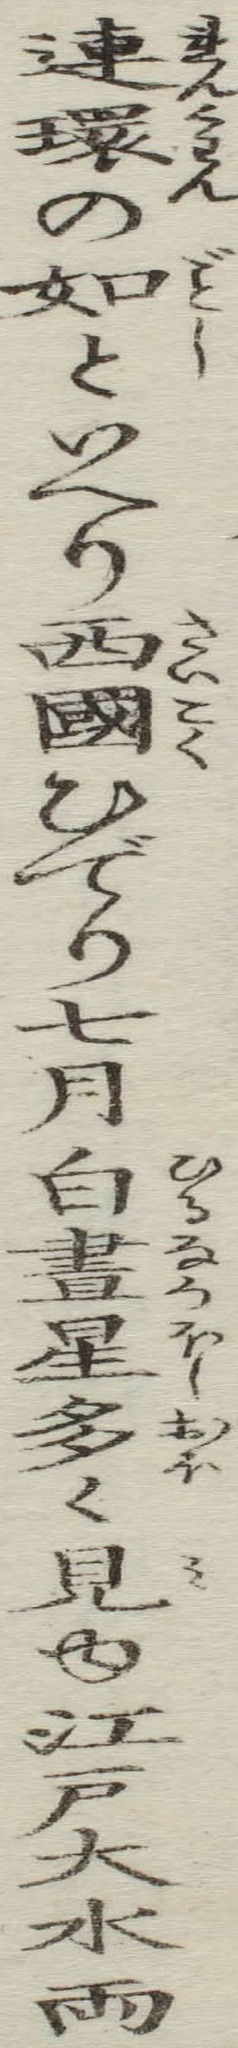連環の如といへり西国ひでり七月白昼星多く見ゆ江戸大水両
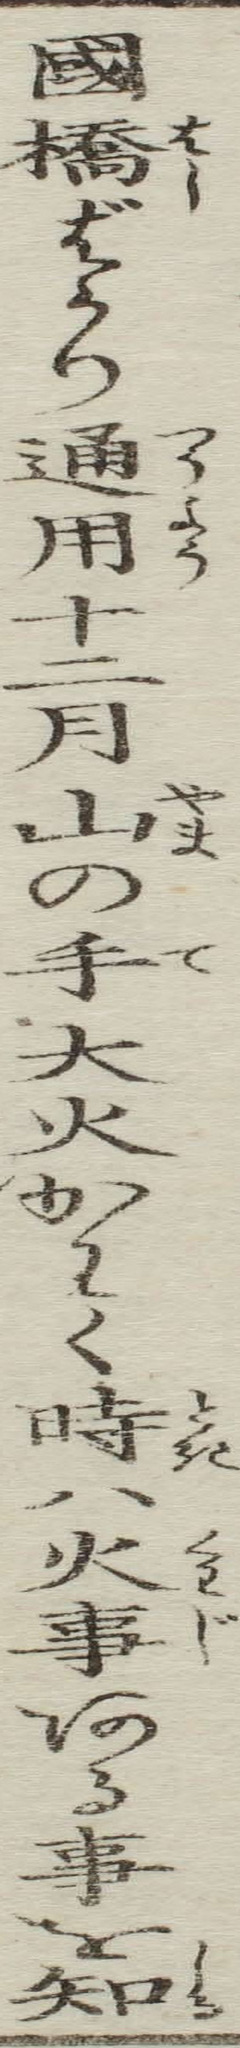国橋ばかり通用十二月山の手大火かわく時は火事ある事を知
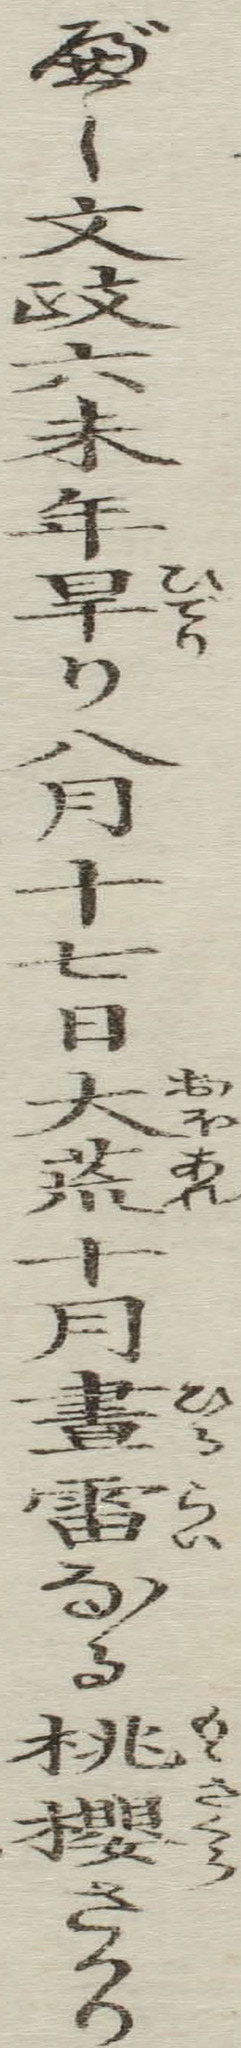べし文政六未年旱り八月十七日大荒十月昼雷なる桃桜さかり
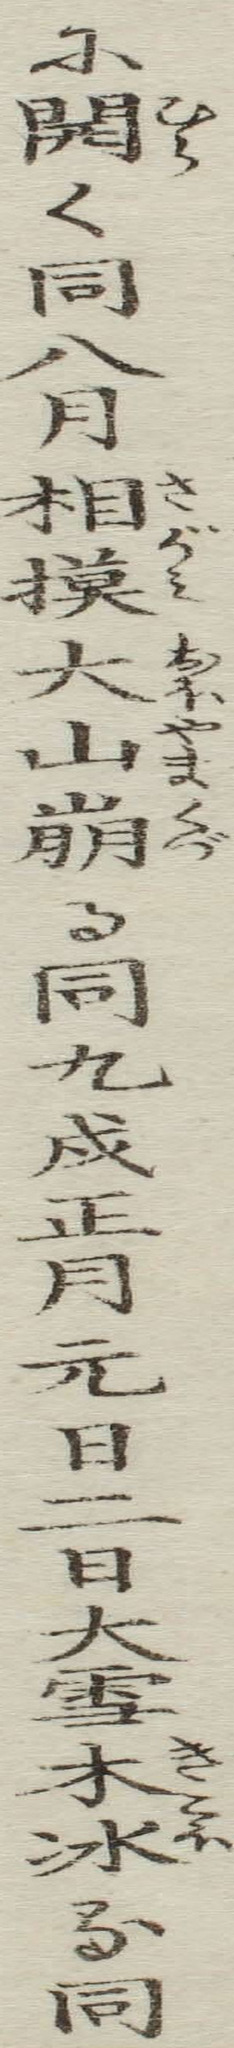に開く同八月相模大山崩る同九戌正月元日二日大雪木冰る同
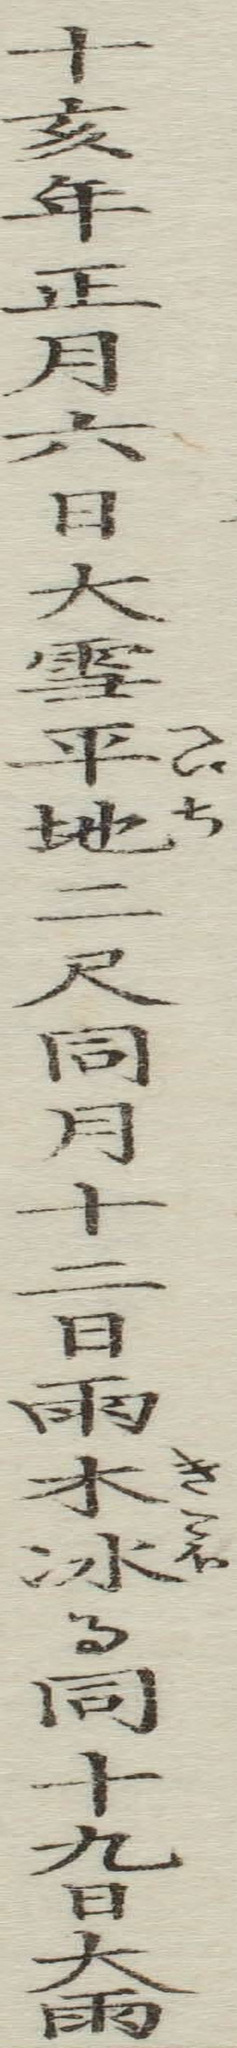十亥年正月六日大雪平地二尺同月十二日雨木冰る同十九日大雨
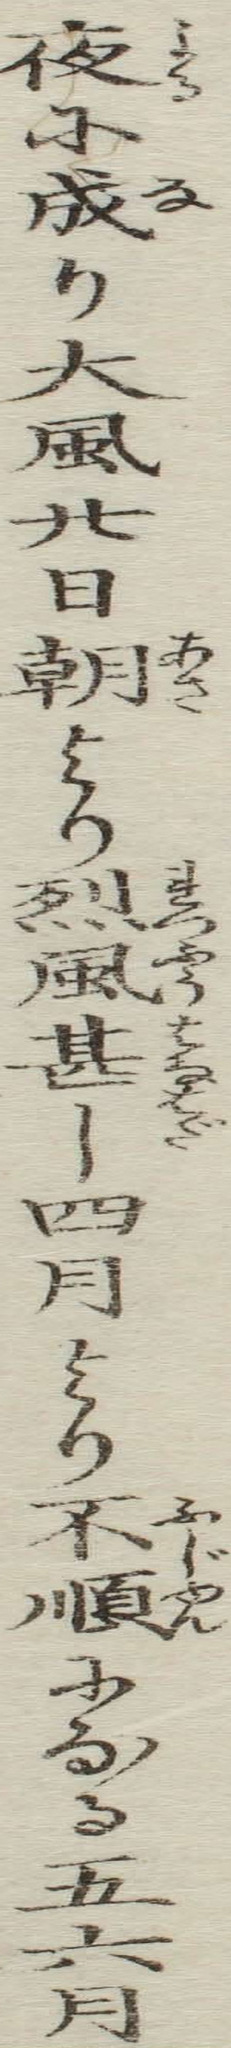夜に成り大風廿日朝より烈風甚し四月より不順になる五六月
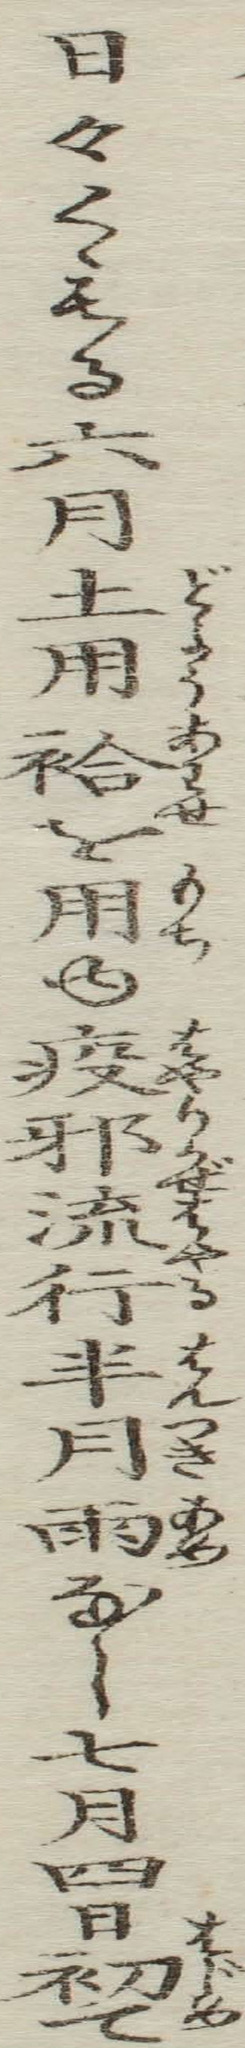日々くもる六月土用袷を用ゆ疫邪流行半月雨なし七月四日初て

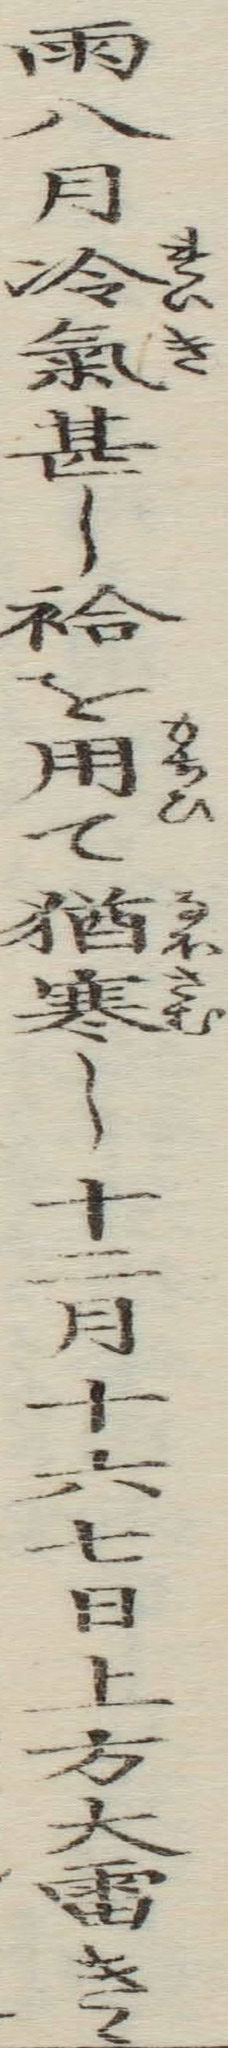雨八月冷気甚し袷を用て猶寒し十二月十六七日上方大雷きゝ
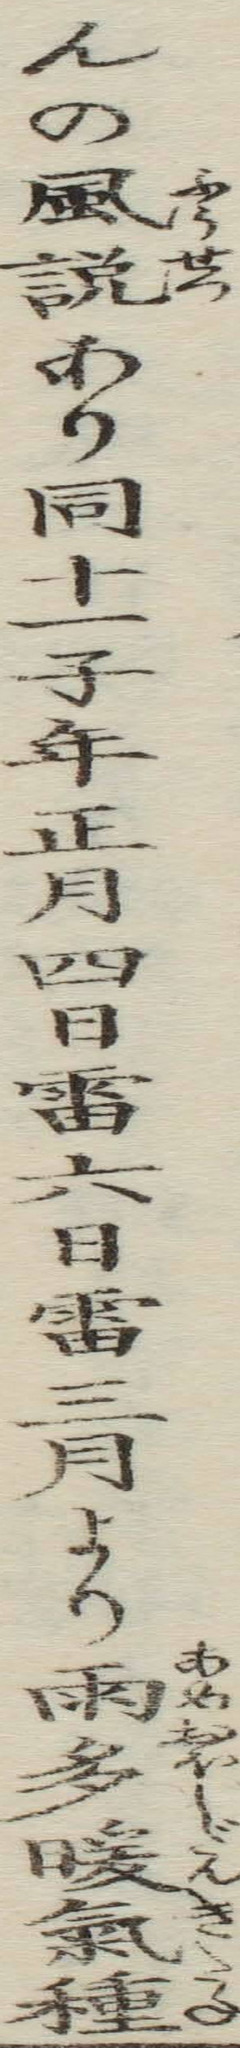んの風説あり同十一子年正月四日雷六日雷三月より雨多暖気種
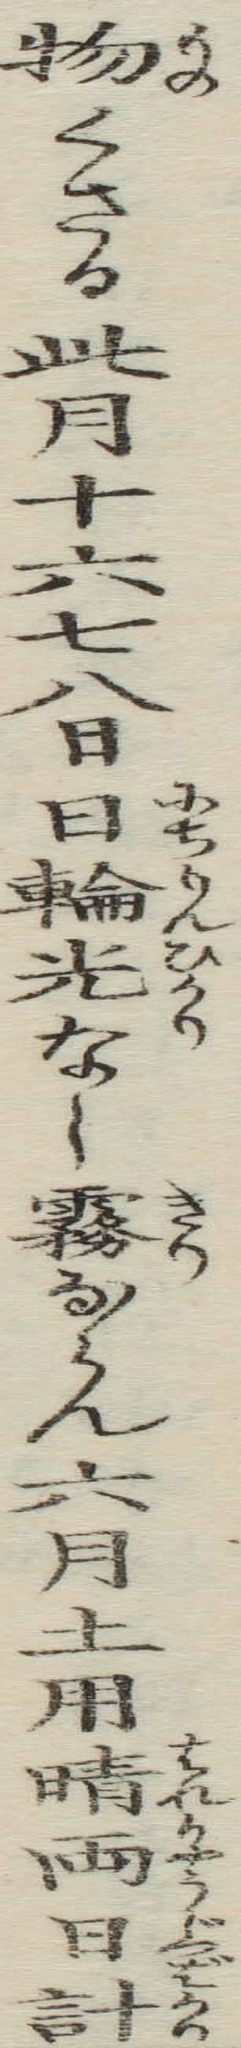物くさる此月十六七八日日輪光なし霧ならん六月土用晴両日計
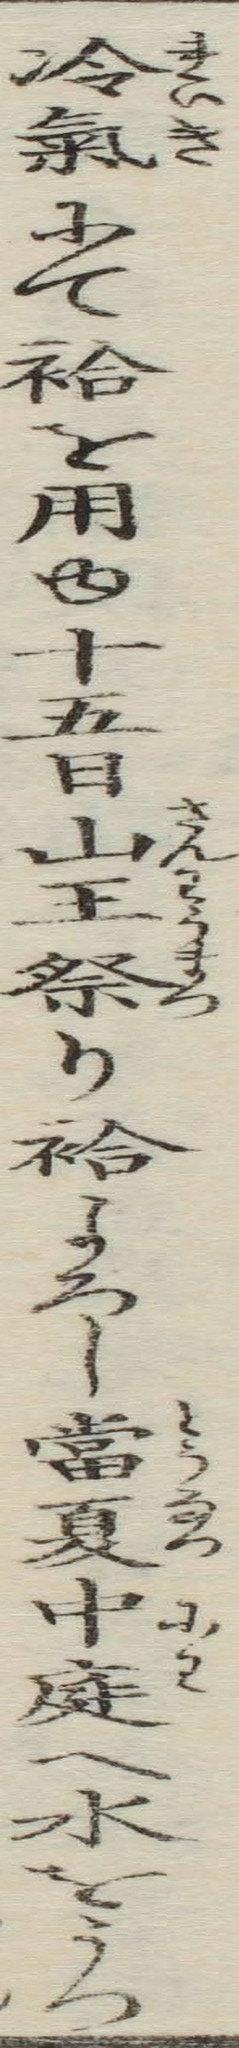冷気にて袷を用ゆ十五日山王祭り袷よろし当夏中庭へ水をうつ
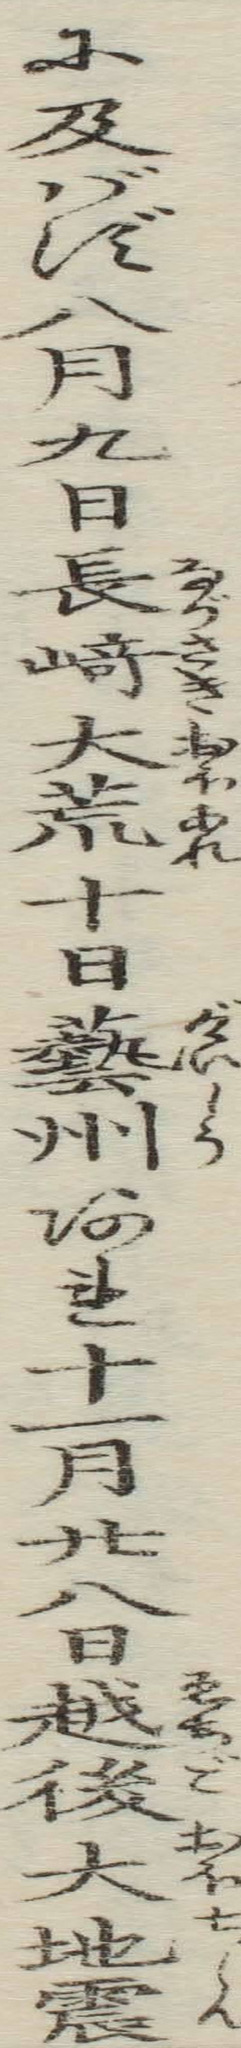に及ばず八月九日長崎大荒十日芸州あれ十一月廿八日越後大地震
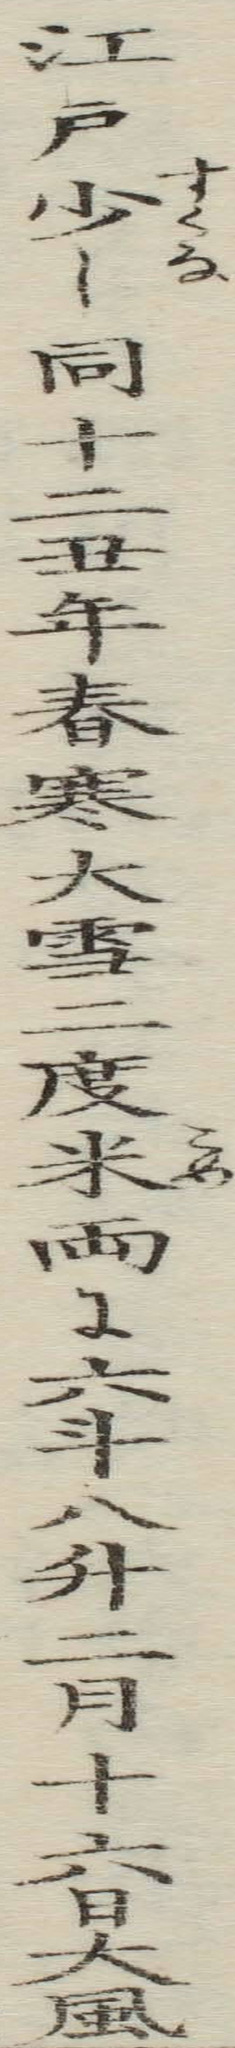江戸少し同十二丑年春寒大雪二度米両に六斗八升二月十六日大風
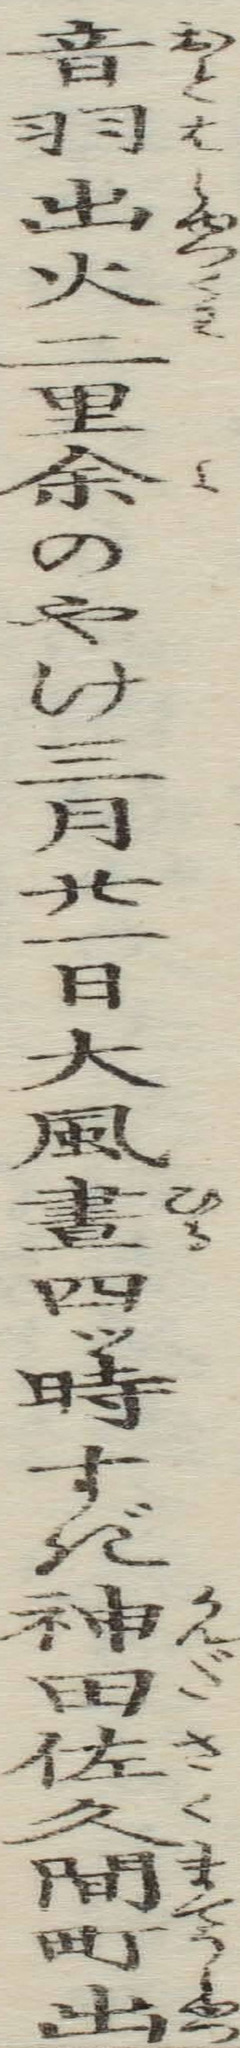音羽出火二里余のやけ三月廿一日大風昼四ッ時すぎ神田佐久間町出
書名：救荒便覧
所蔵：国文学研究資料館
